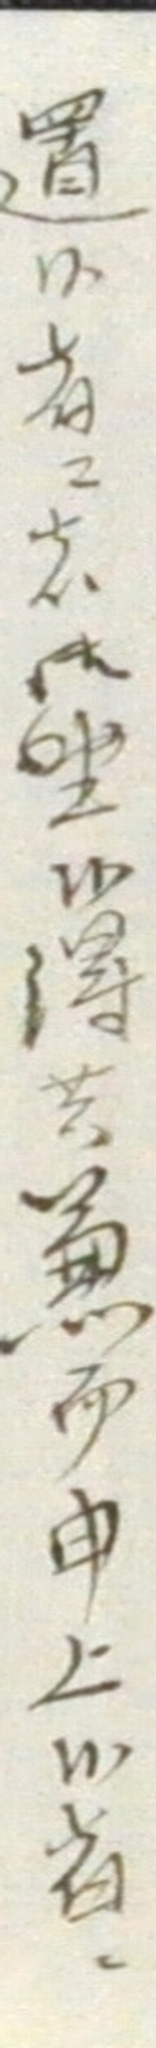置候者に者御坐候得共兼而申上候旨に
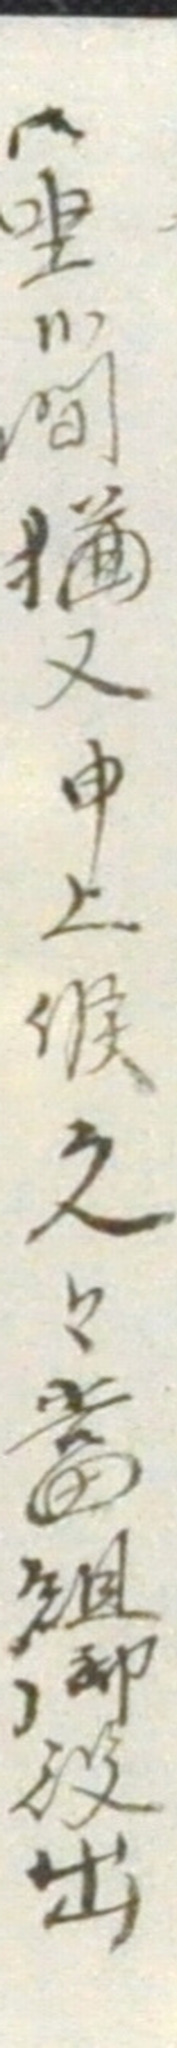御坐候間猶又申上候元々番組御役出
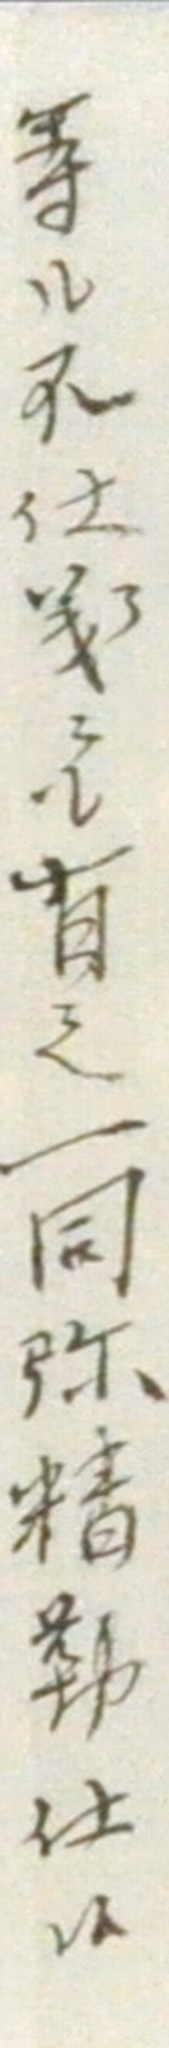等も不仕義ニも有之一同弥精勤仕候
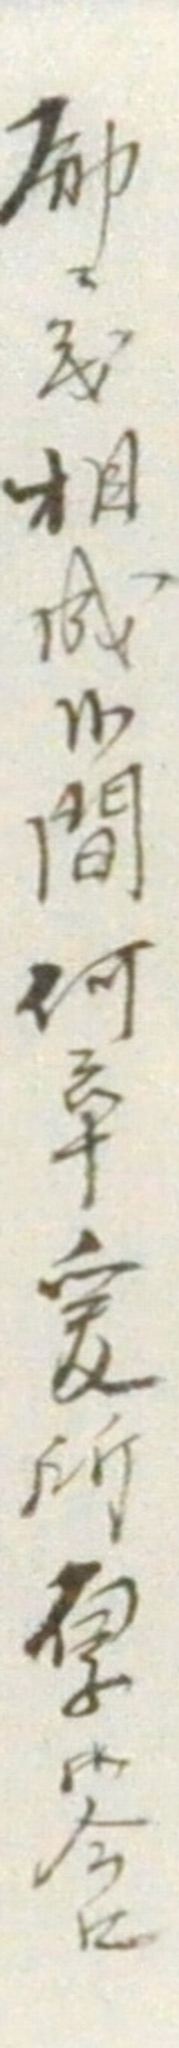励ニ茂相成候間何卒爰所厚御含
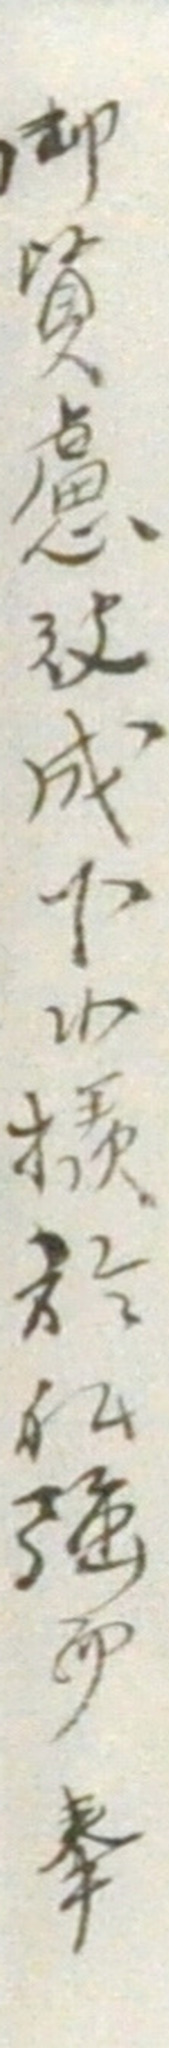御賢慮被成下候様於私強而奉
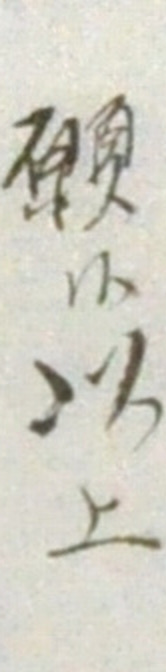願候以上
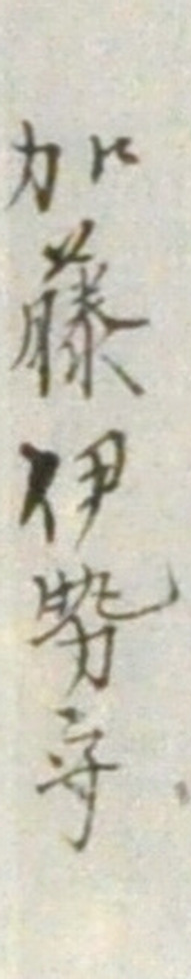加藤伊勢守

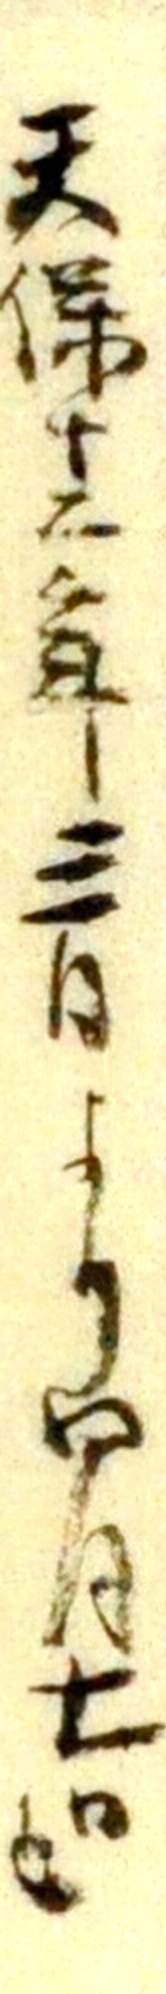天保十二年三月より四月七日迄

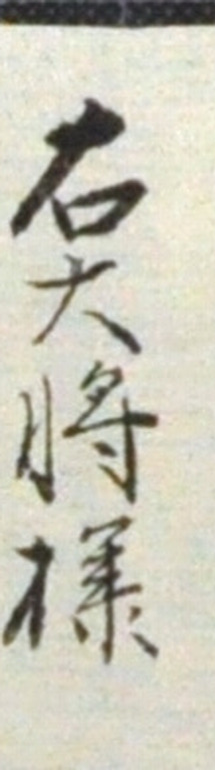右大将様
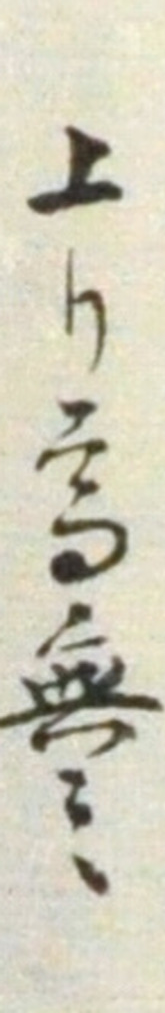上り高無之
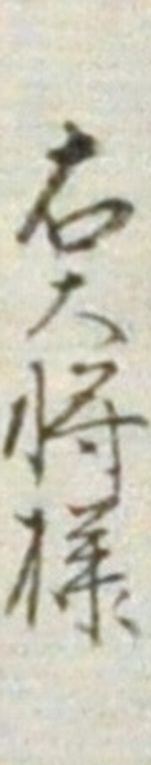右大将様
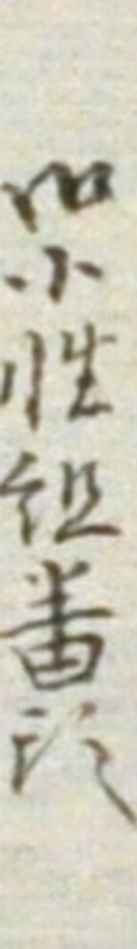御小姓組番頭
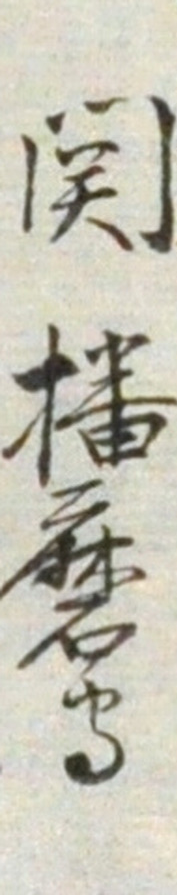関播磨守
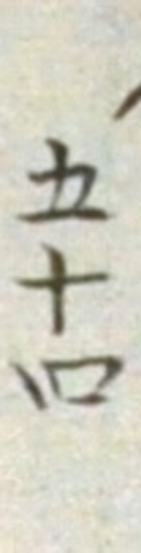五十四
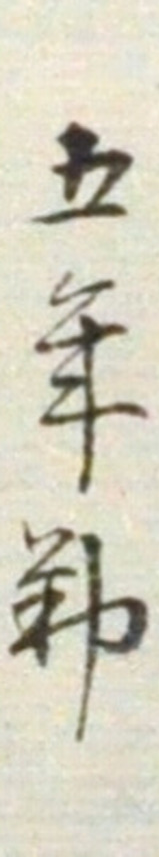五年勤
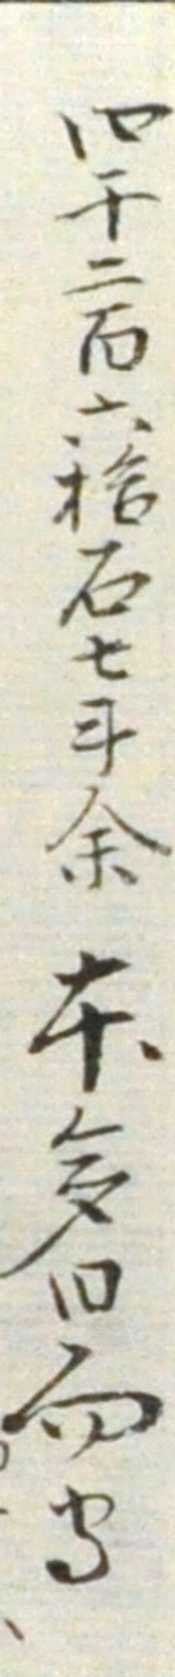四千二百六拾石七斗余本多日向守
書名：若年寄御役中御調書付
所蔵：伊那市立高遠町図書館・合同会社AMANE
